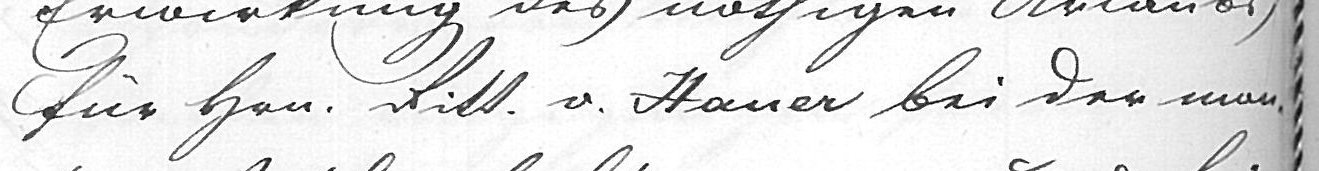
für Hrn. Ritt. v. Hauer bei der mon-
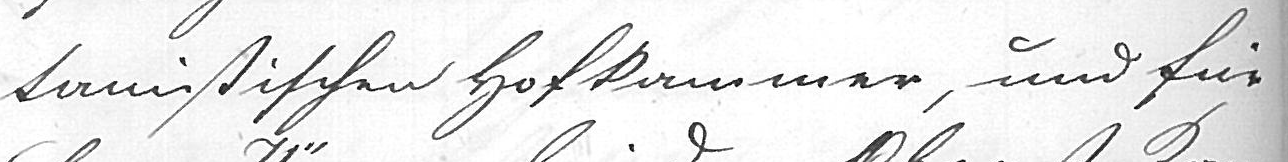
tanistischen Hofkammer, und für
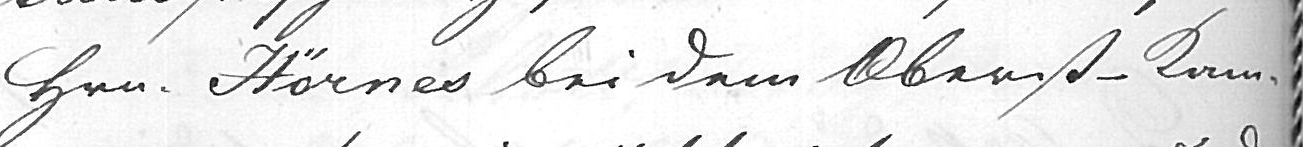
Hrn. Hörnes bei dem Oberst Kam-
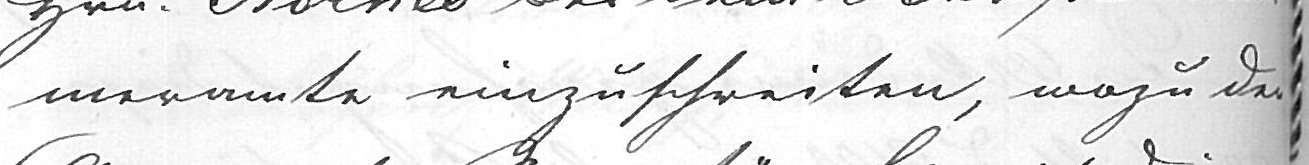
meramte einzuschreiten, wozu der
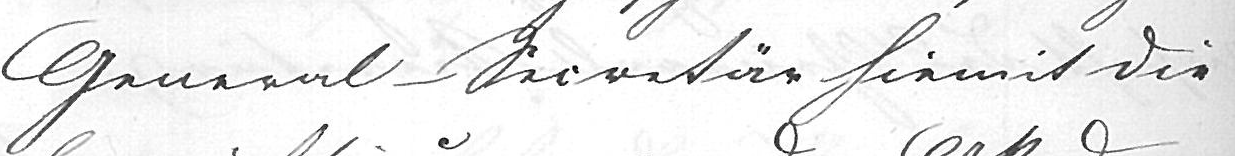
General-Secretär hiemit die
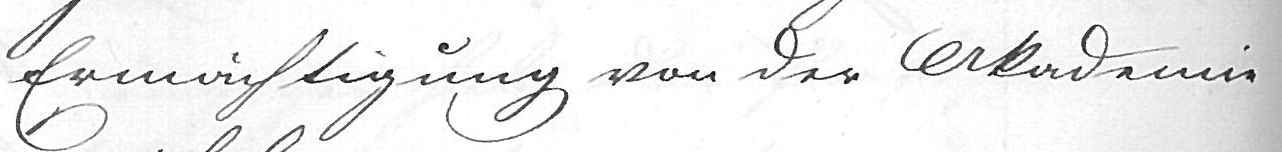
Ermächtigung von der Akademie
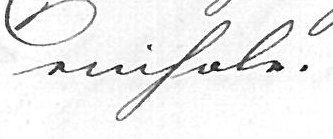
einhole.
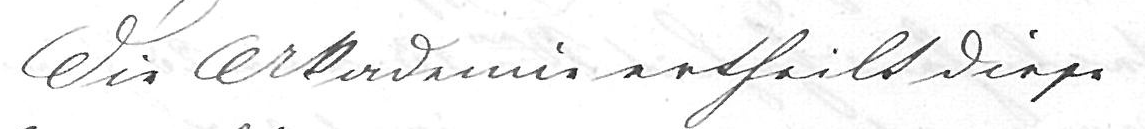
Die Akademie ertheilt diese
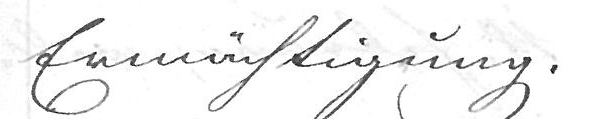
Ermächtigung.
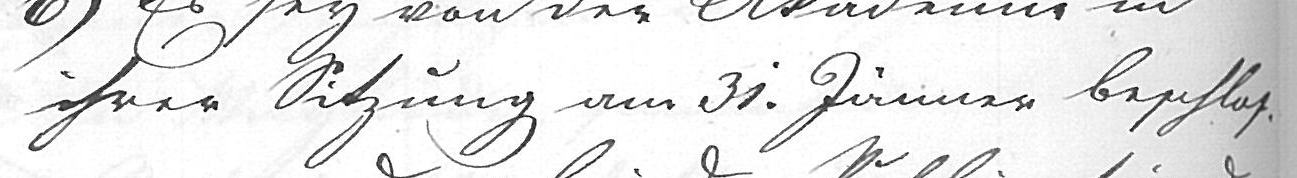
b) Es sey von der Akademie in
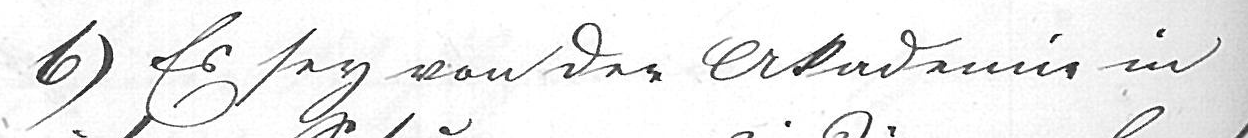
ihrer Sitzung am 31. Jänner beschlos-
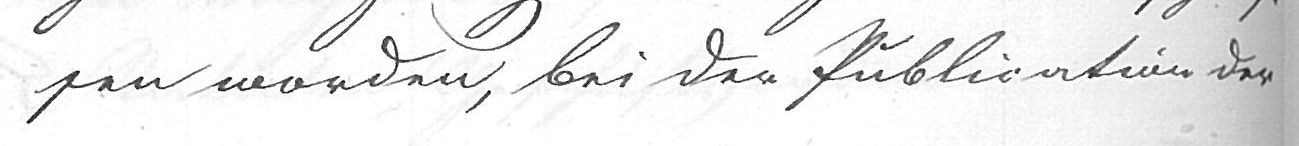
sen worden, bei der Publication der
